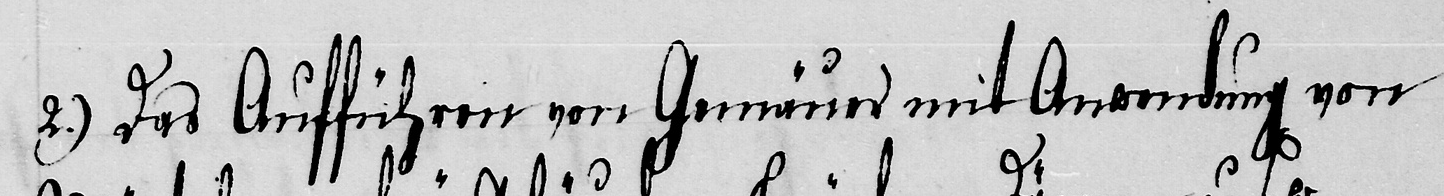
2.) Das Aufführen von Gemäuer mit Anwendung von
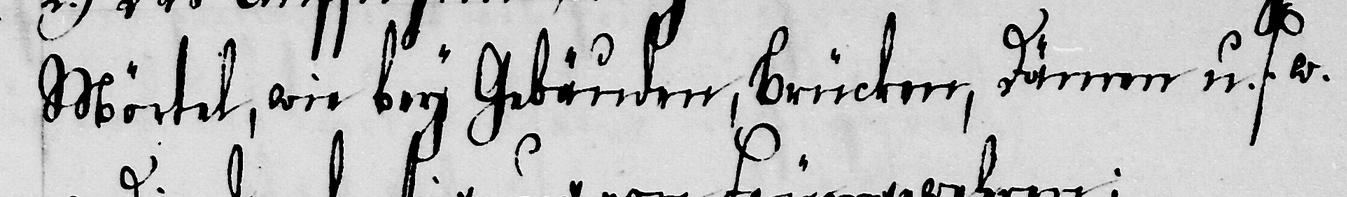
Mörtel, wie bey Gebäuden, Brücken, Dämen u. s.
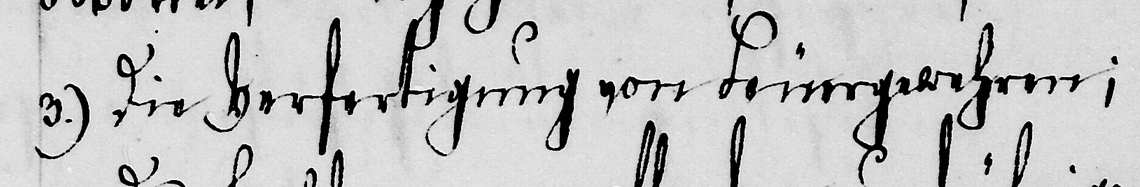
3.) Die Verfertigung von Feuergewehren;
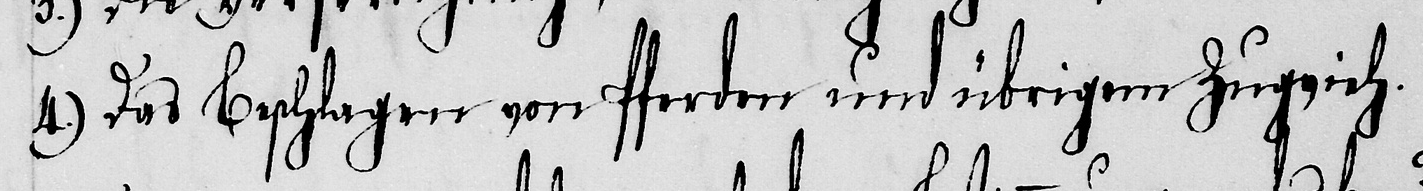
4.) Das Beschlagen von Pferden und übrigem Zugvieh.
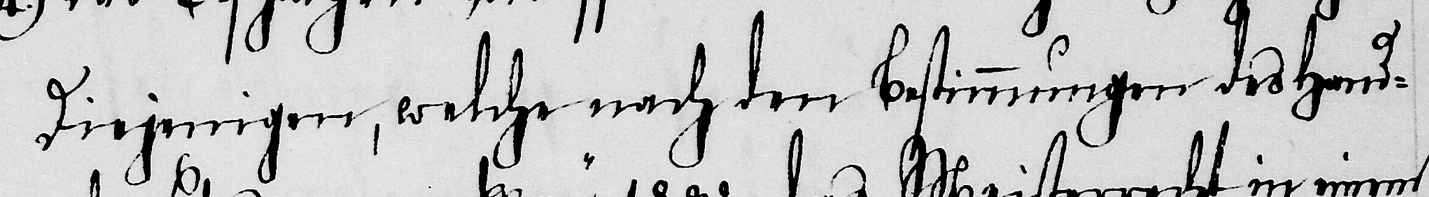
Diejenigen, welche nach den Bestimmungen des Hand¬
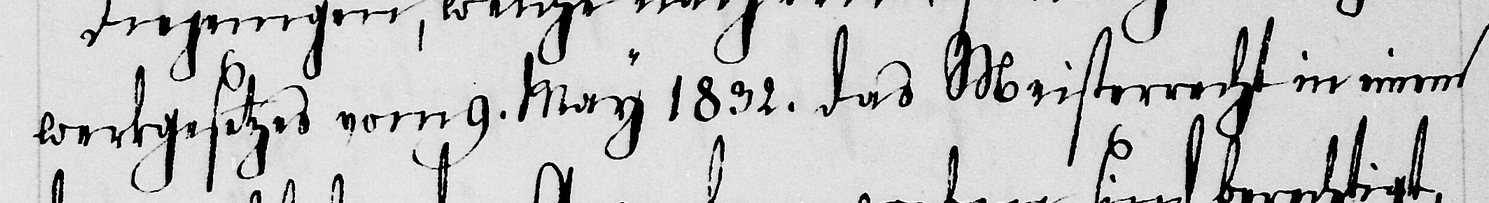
werkgesetzes vom 9. May 1832. das Meisterrecht in einem
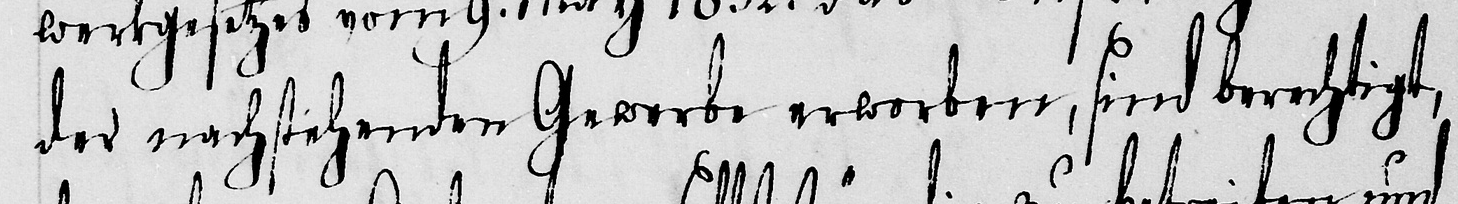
der nachstehenden Gewerbe erworben, sind berechtigt,
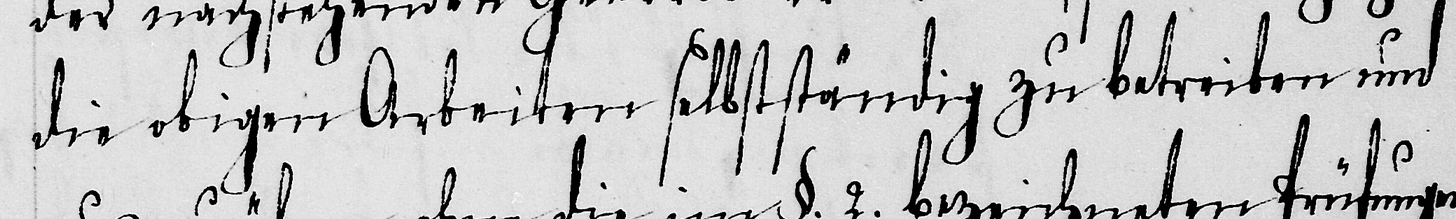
die obigen Arbeiten selbstständig zu betreiben und
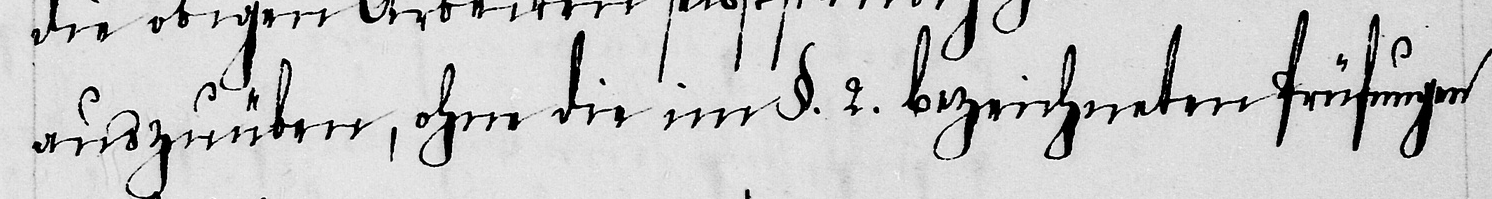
auszuüben, ohne die im §. 2. bezeichneten Prüfungen
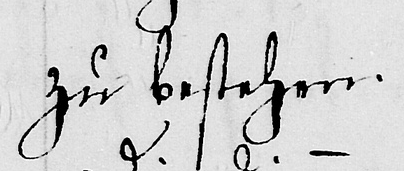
zu bestehen.
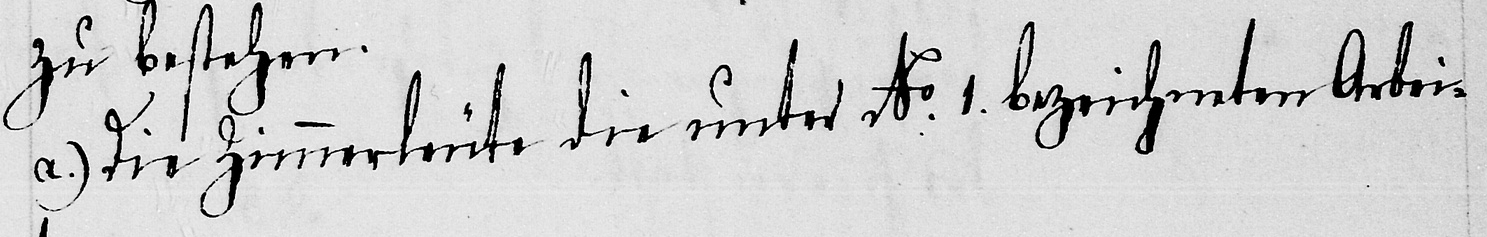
a.) Die Zimmerleute die unter No.1. bezeichneten Arbei¬
